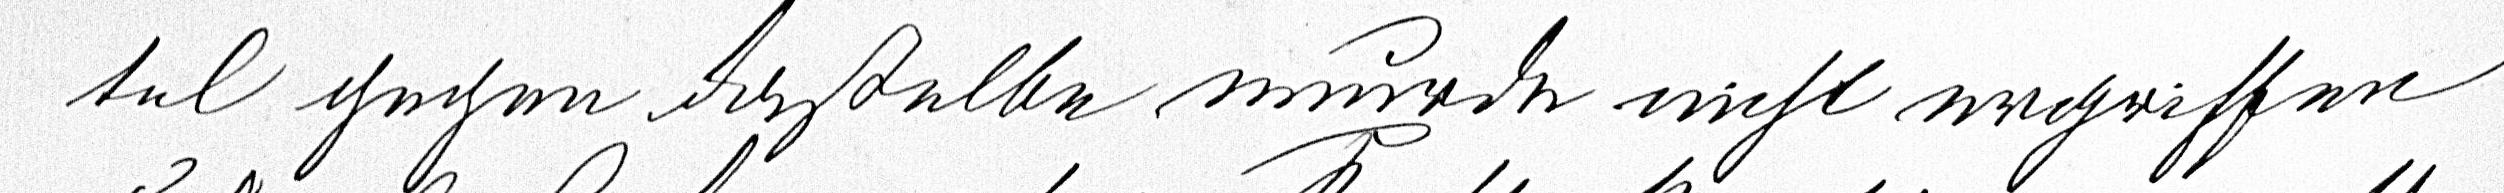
tel gegen daßelbe wurde nicht ergriffen
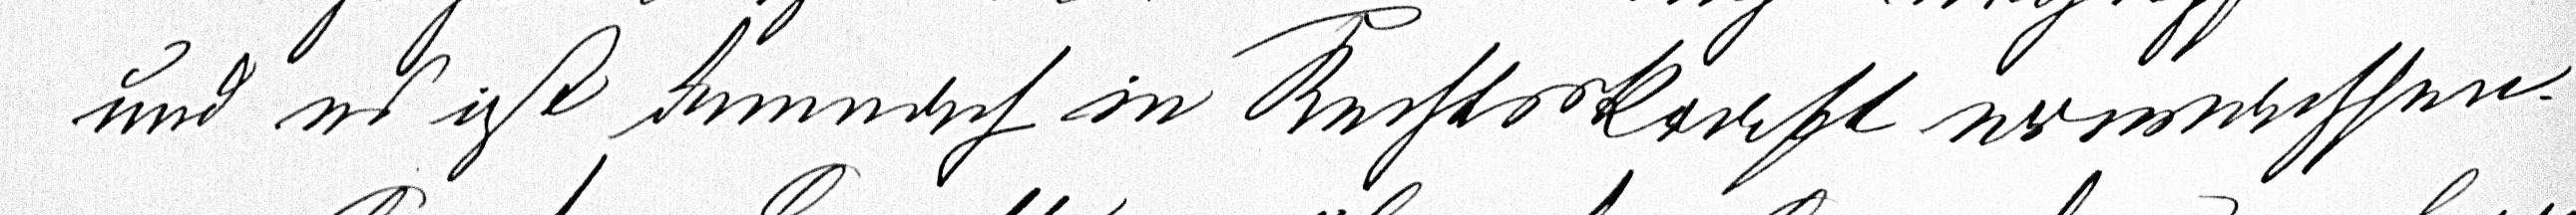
und es ist demnach in Rechtskraft erwachsen.
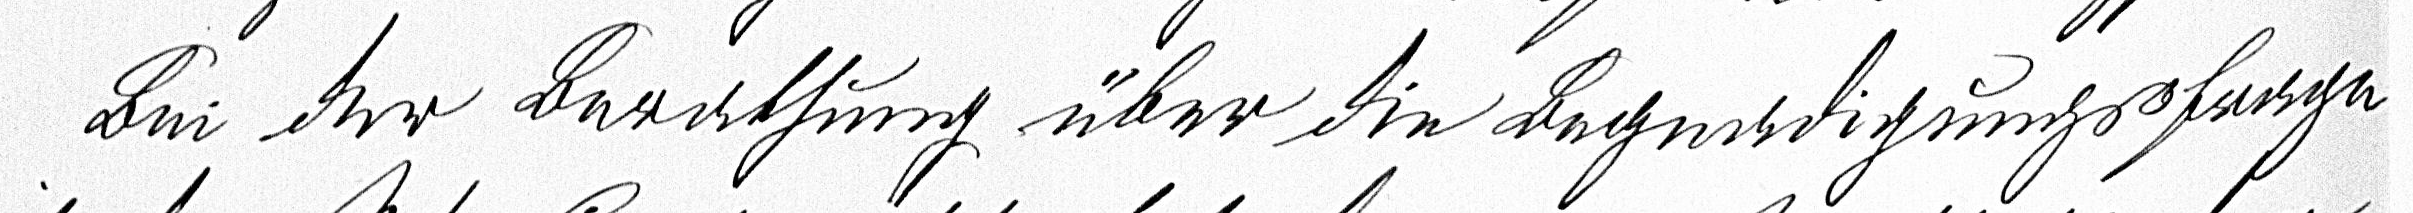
Bei der Berathung über die Begnadigungsfrage
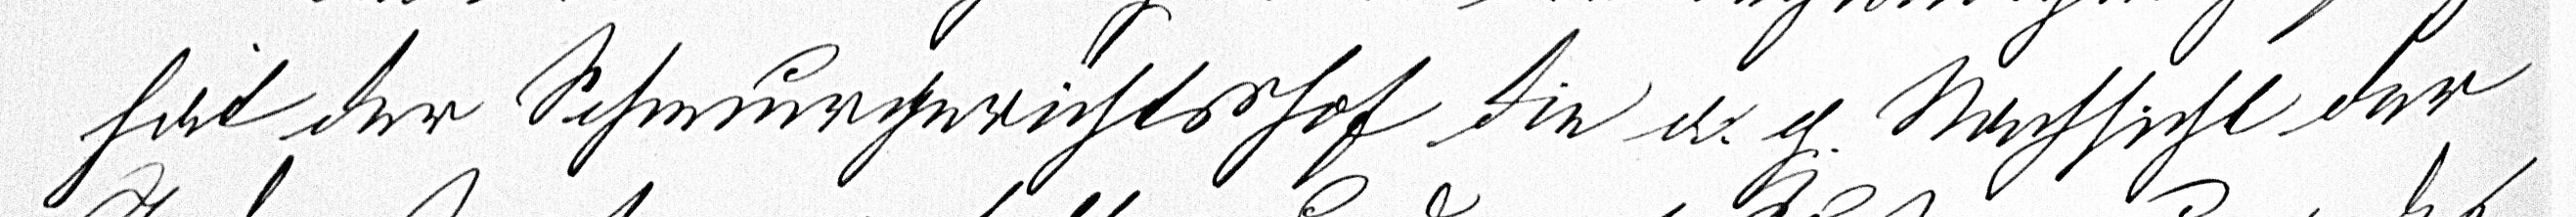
hat der Schwurgerichtshof die a. g. Nachsicht der
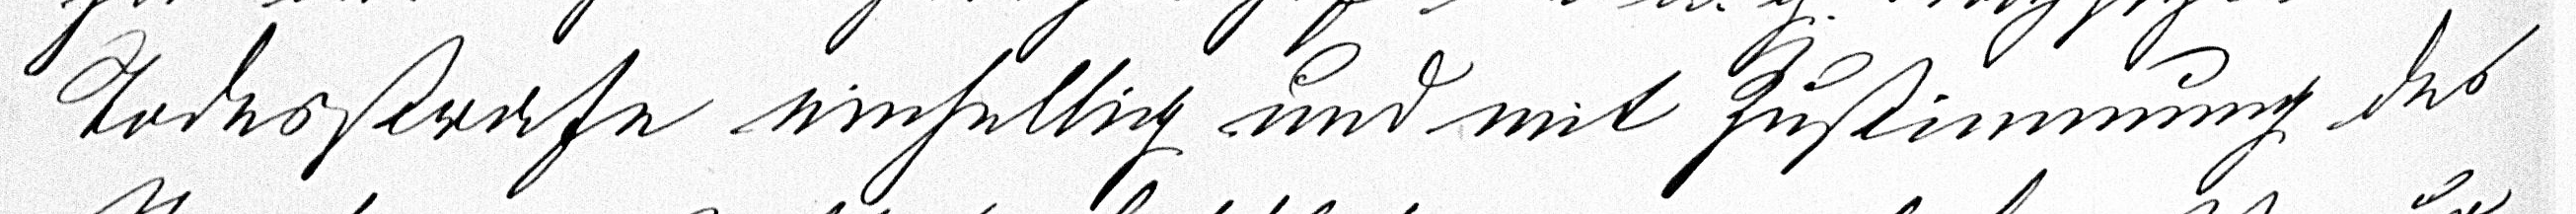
Todesstrafe einhellig und mit Zustimmung des
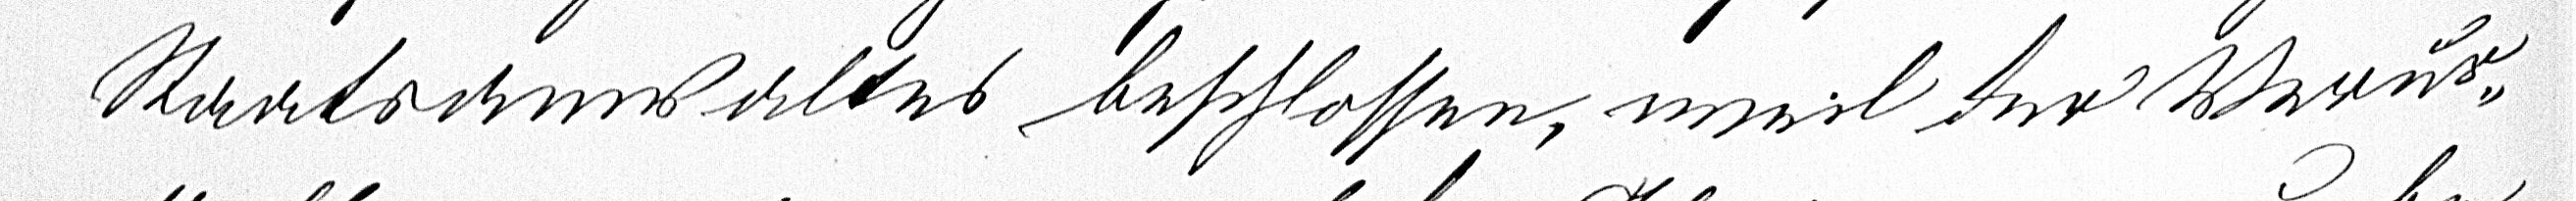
Staatsanwaltes beschlossen, weil der Verur¬
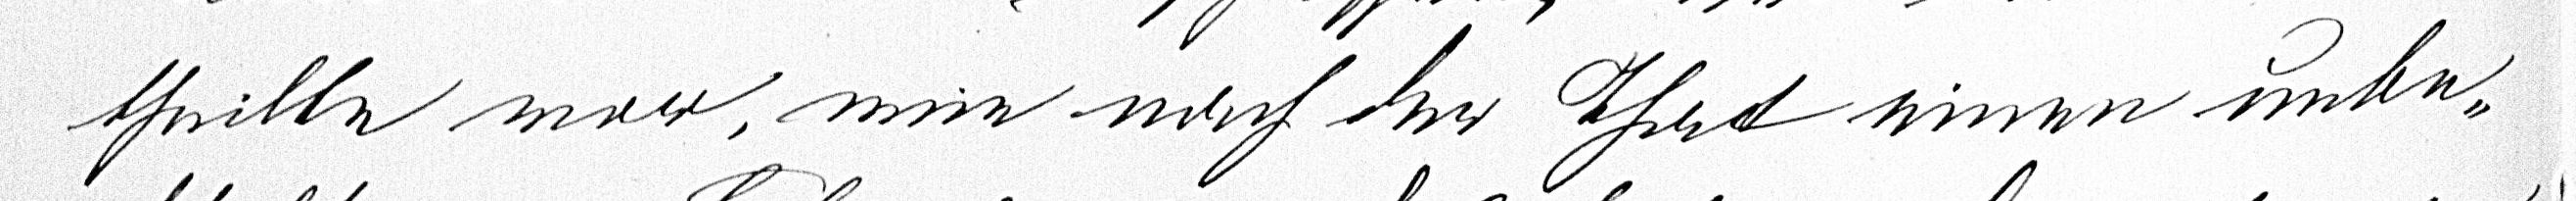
theilte vor, wie nach der That einen unbe¬
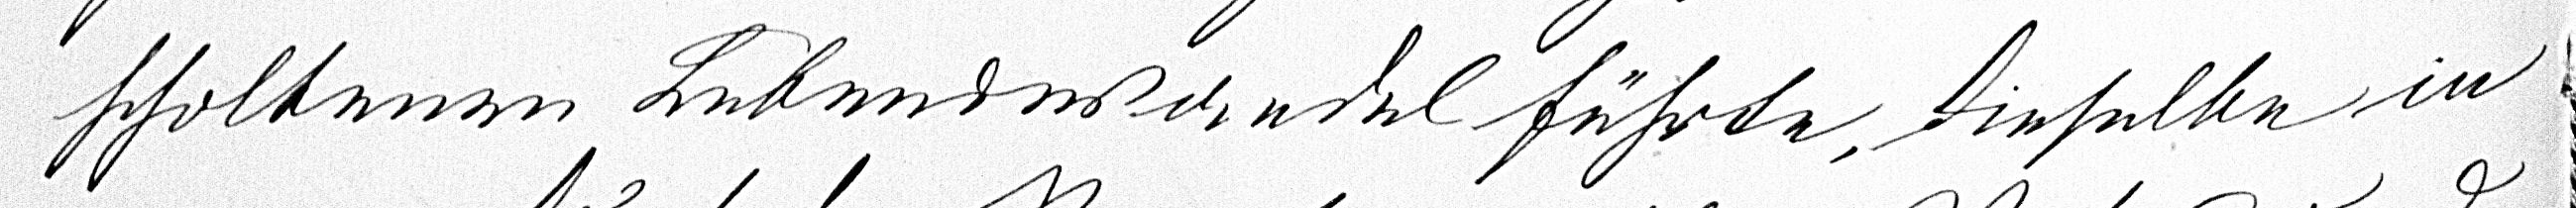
scholtenen Lebenswandel führte, dieselbe in
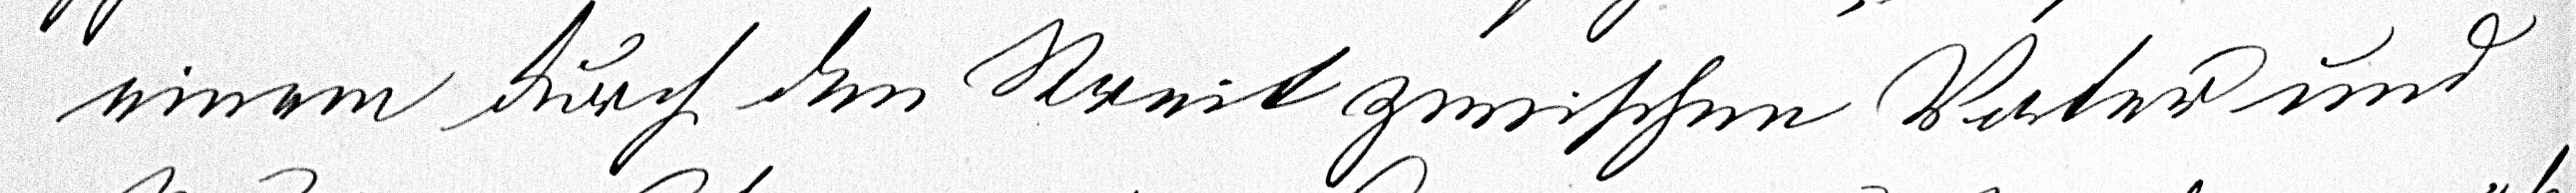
einem durch den Streit zwischen Vater und
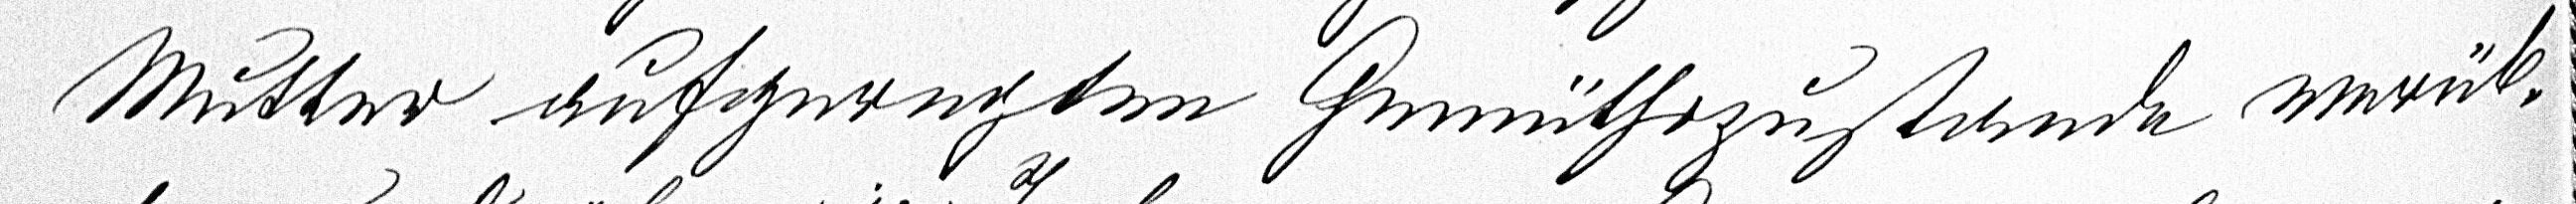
Mutter aufgeregten Gemüthszustande verüb¬
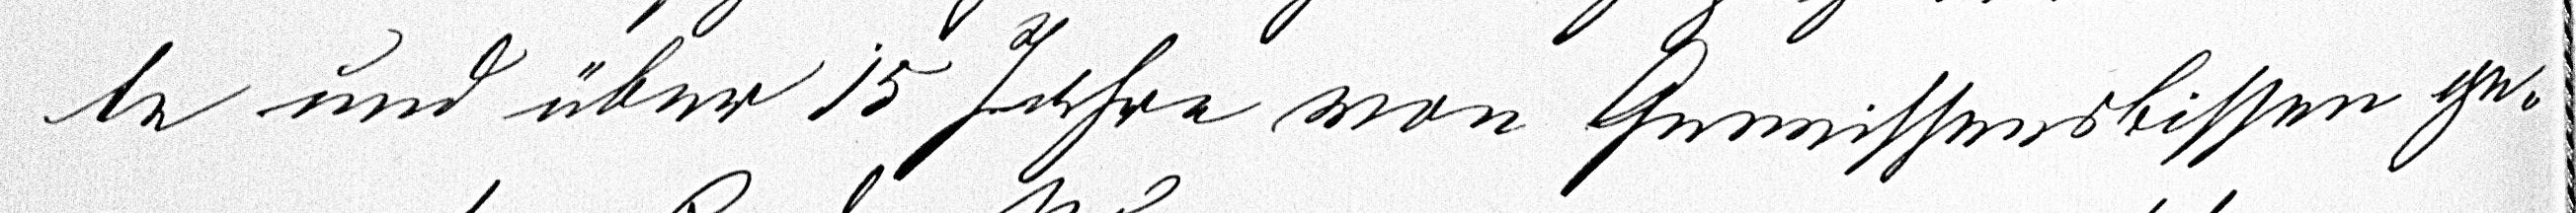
te und über 15 Jahre von Gewissensbissen ge¬
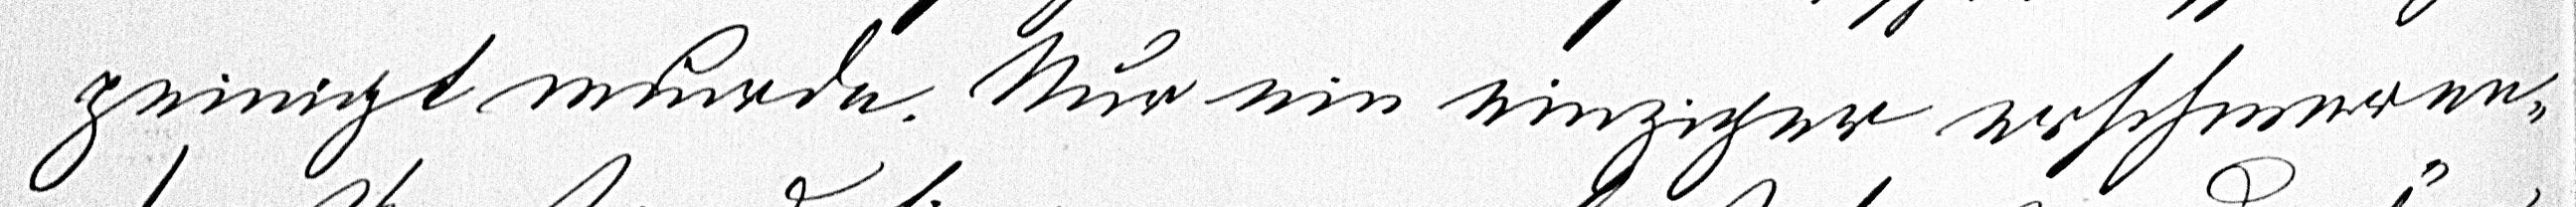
peinigt wurde. Nur ein einziger erschweren¬
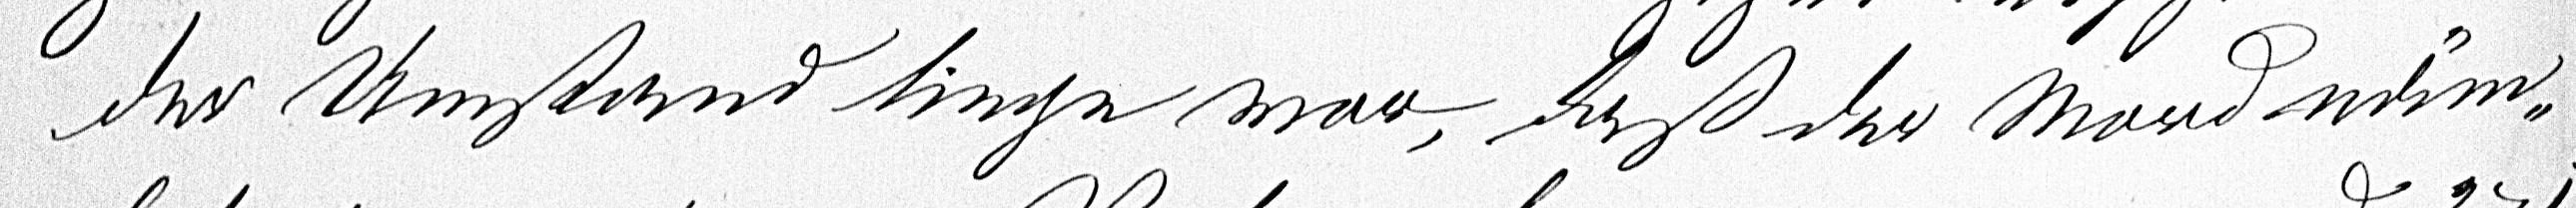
der Umstand liege vor, daß der Mord näm¬
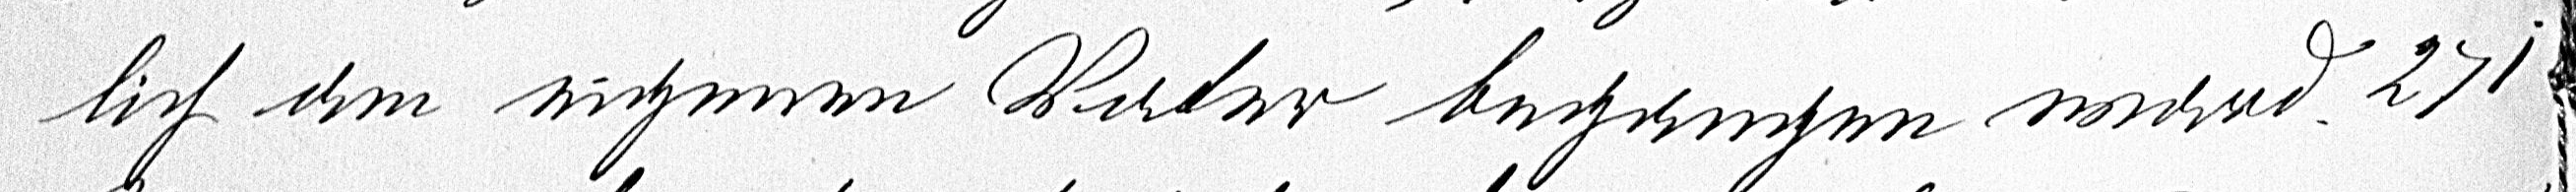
lich am eigenen Vater begangen ward. 271
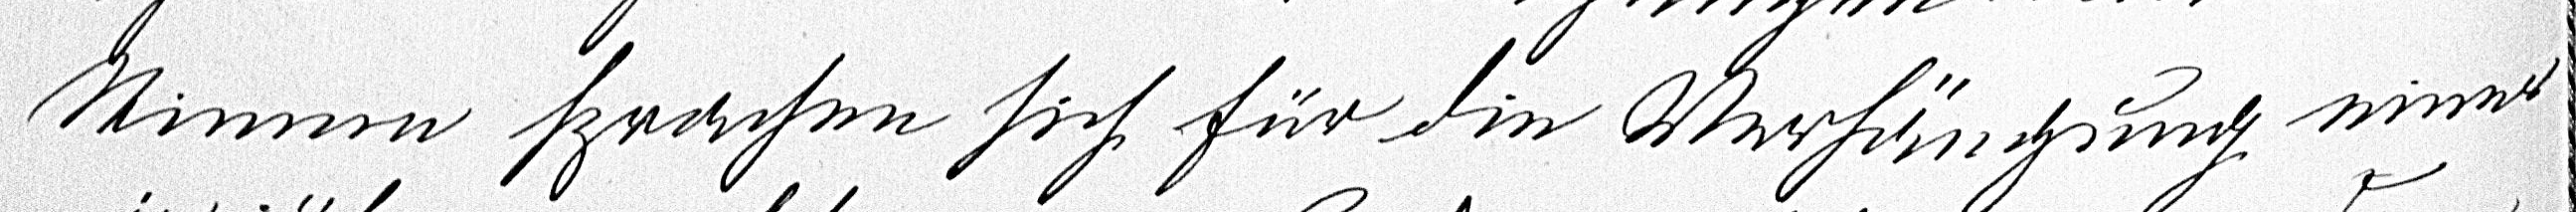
Stimme sprachen sich für die Verhängung einer
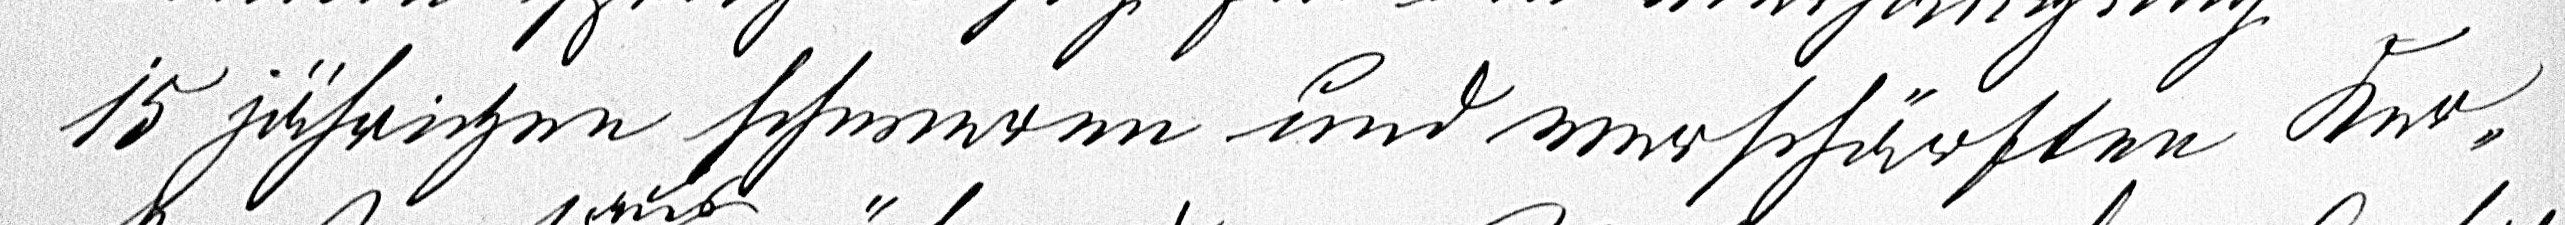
15 jährigen schweren und verschärften Ker¬
